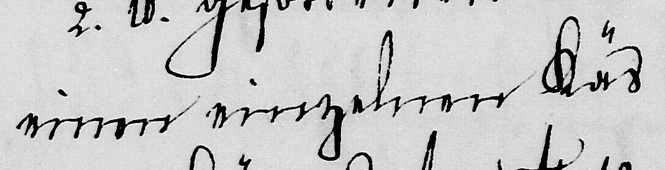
einen einzelnen Käs
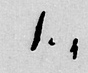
1.
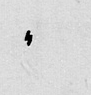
2.
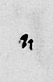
2.
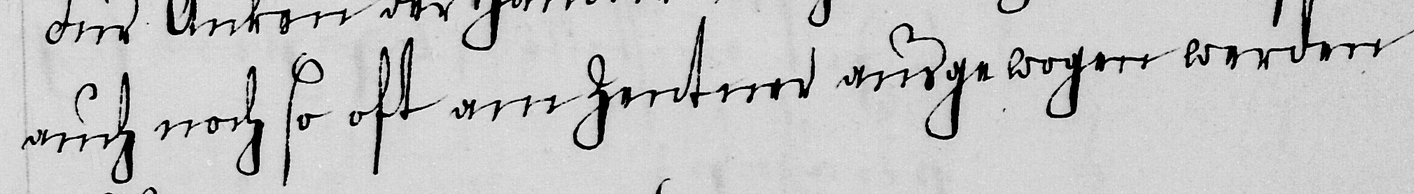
auch noch so oft am Zentner ausgewogen werden
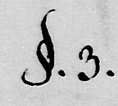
§. 3.
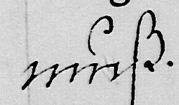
muß.
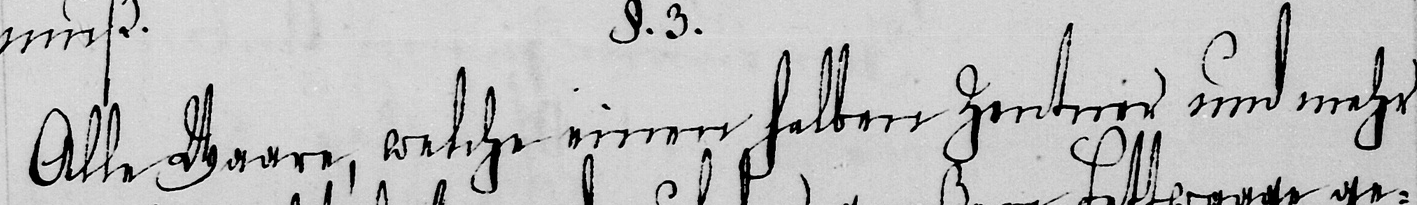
Alle Waare, welche einen halben Zentner und mehr
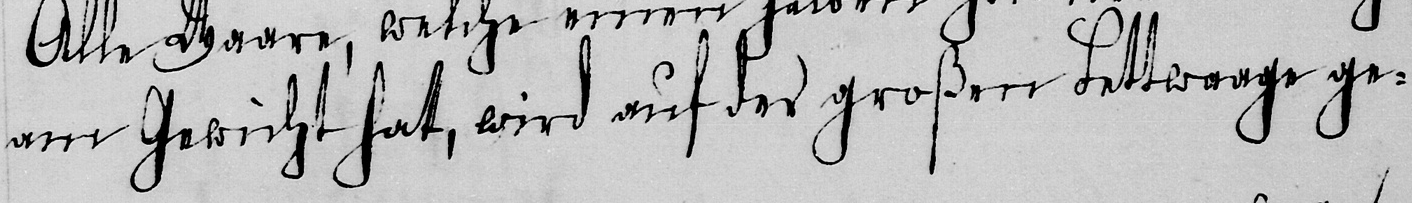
am Gewicht hat, wird auf der großen Fettwaage ge-
